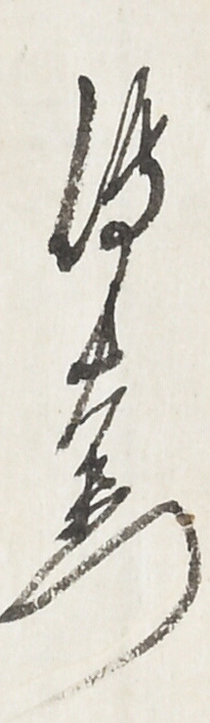金右衛門
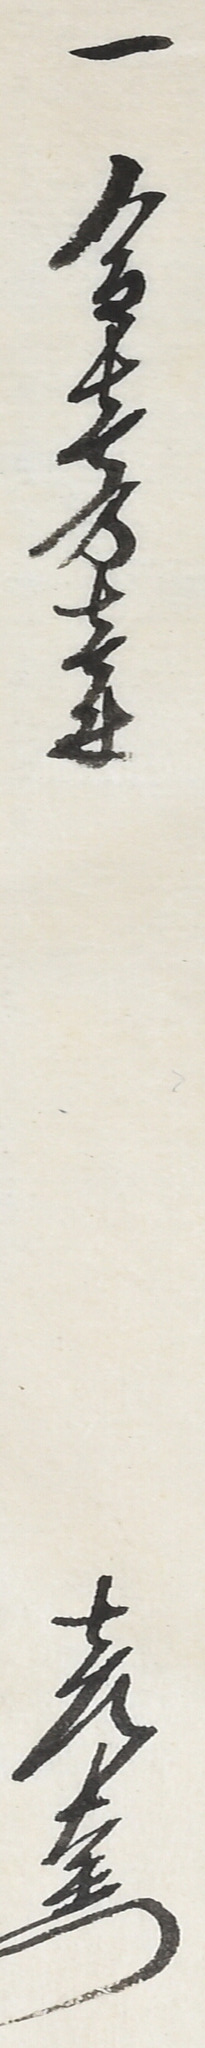一金壱分壱朱彦右衛門
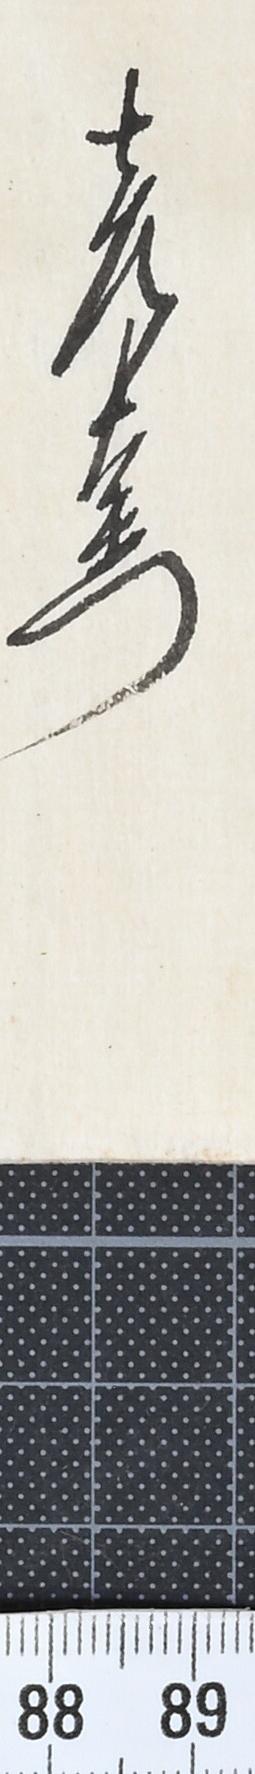金右衛門
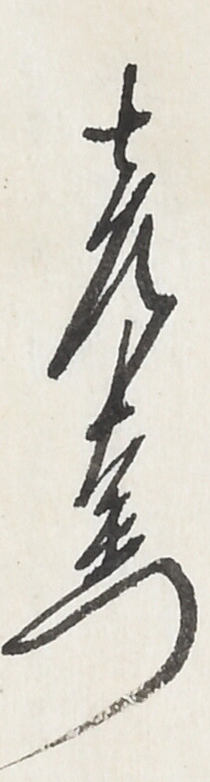金右衛門

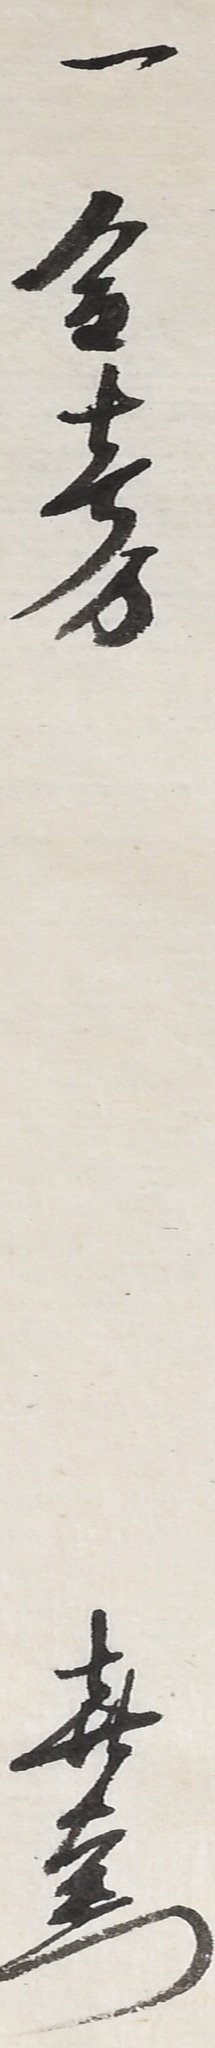一金壱分喜右衛門
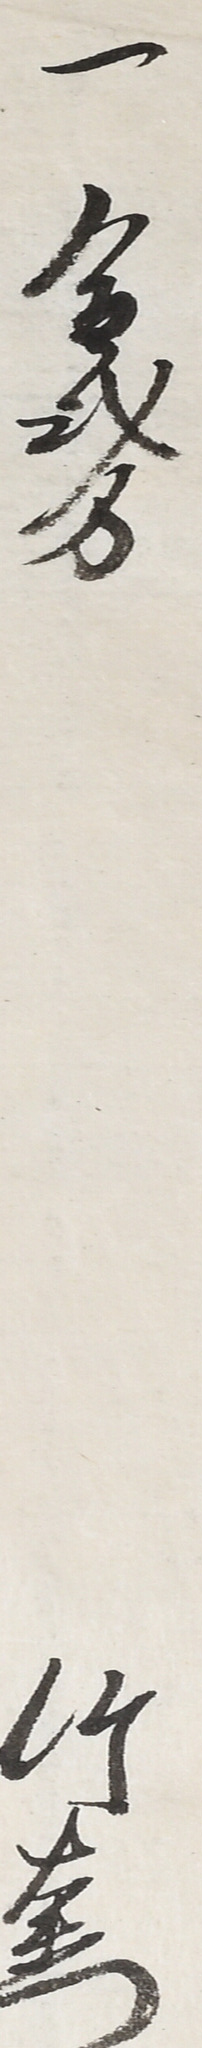一金壱分竹右衛門
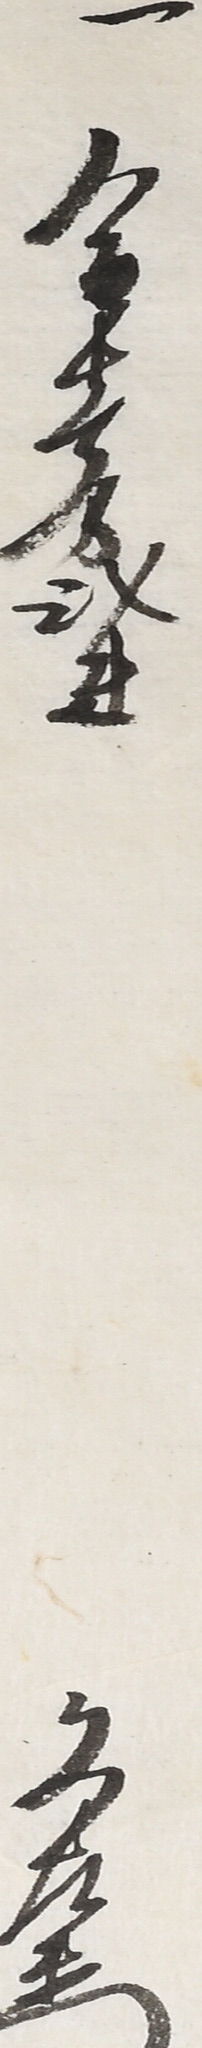一金壱分弐朱又左衛門
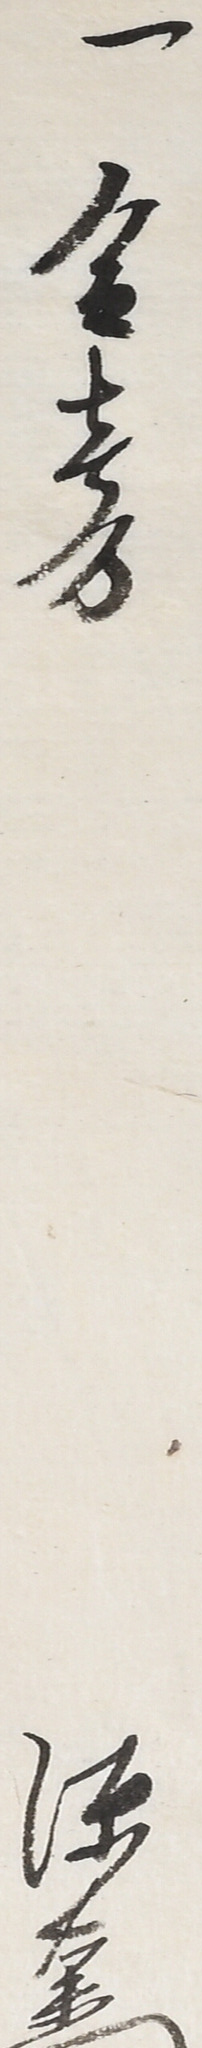一金壱分源右衛門
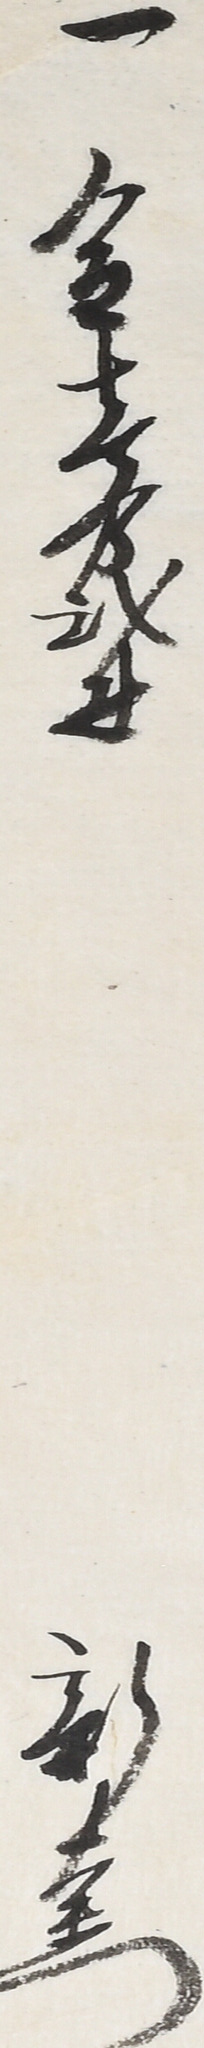一金壱分弐朱新右衛門
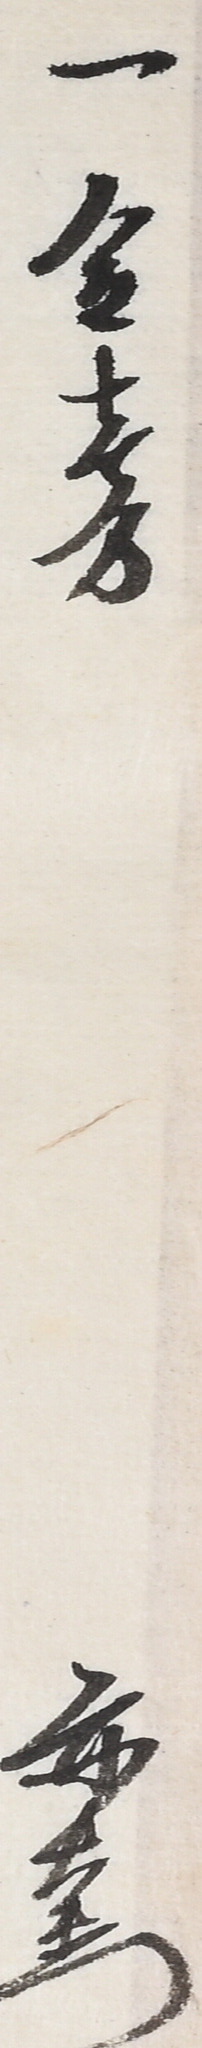一金壱分喜右衛門
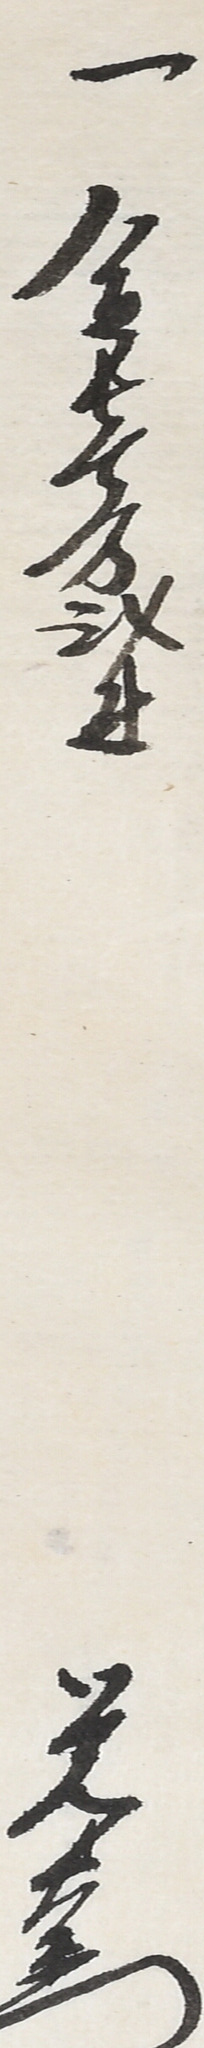一金壱分弐朱覚右衛門
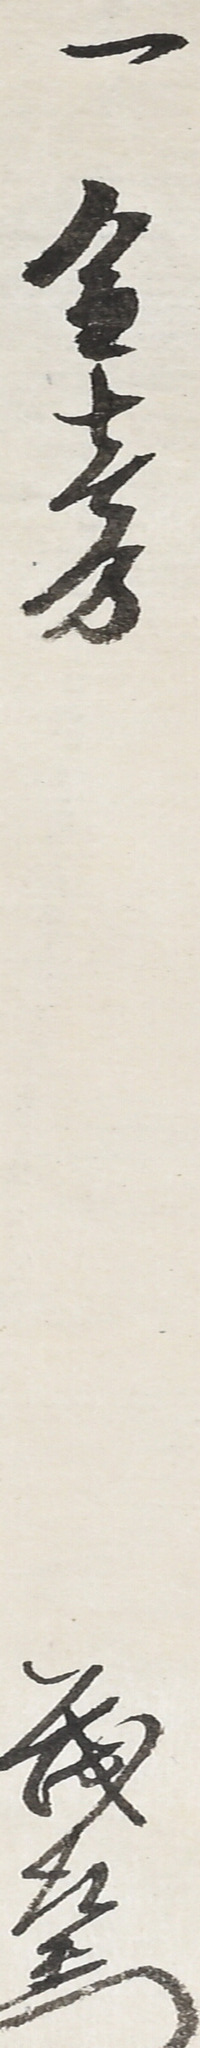一金壱分茂左衛門
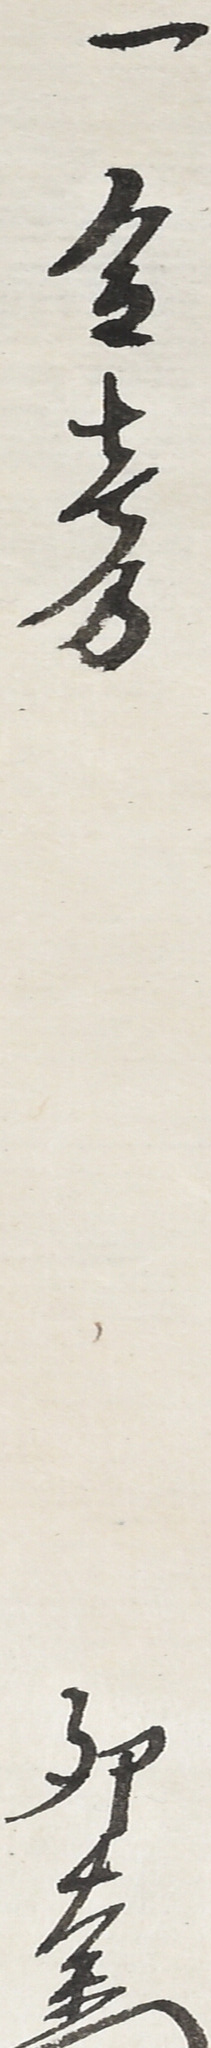一金壱分卯右衛門
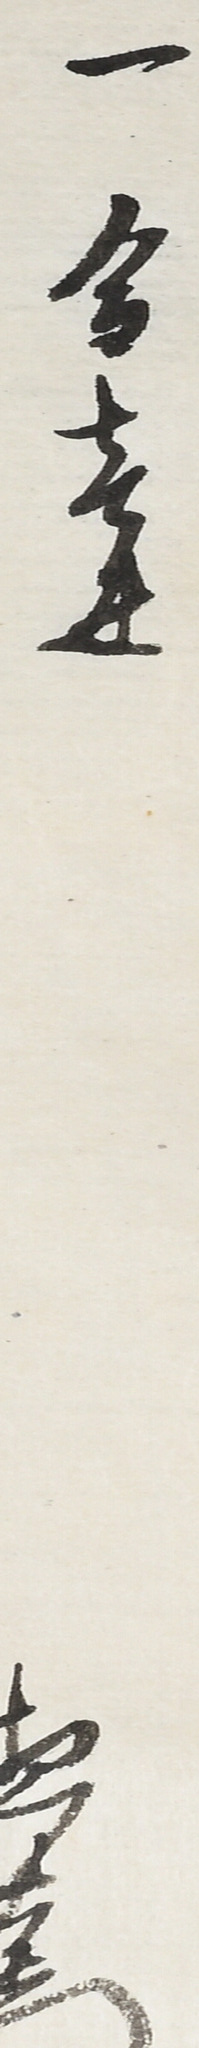一金壱朱惣右衛門

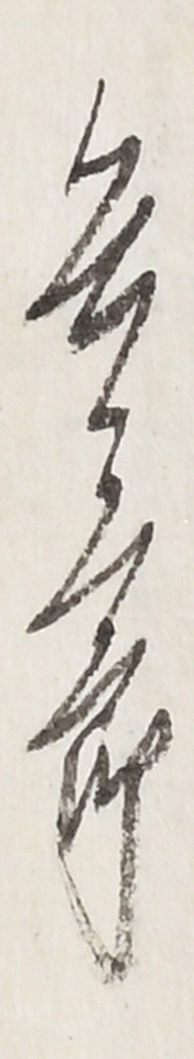兵三郎
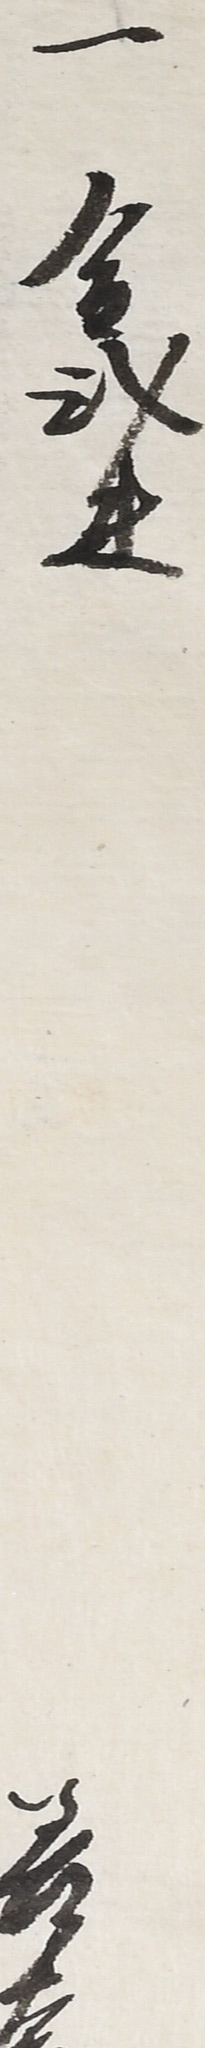一金弐朱善右衛門
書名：御拝地百五拾年御祝儀献上御目録名前
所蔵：伊那市立高遠町図書館・合同会社AMANE
